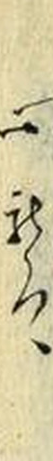一新右衛門へ
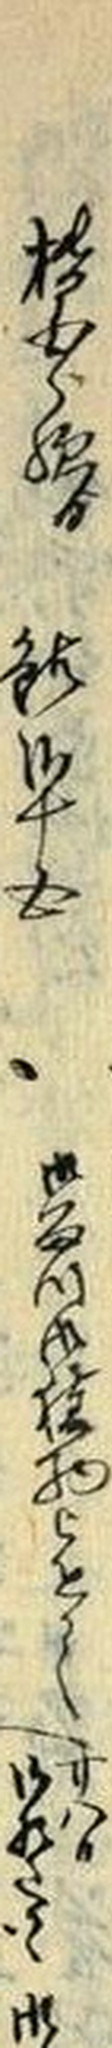揩五郎様ゟ鮎弐十五御留川御獲物被進之
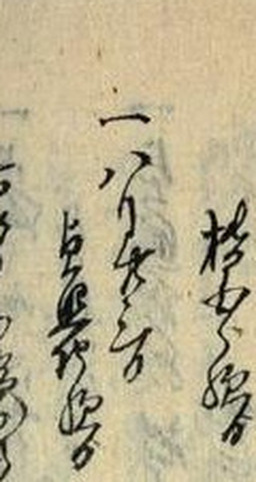一八月廿三日
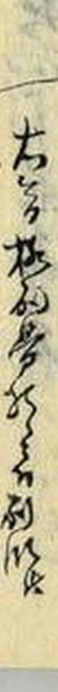右今日格別骨折候ニ付別段被
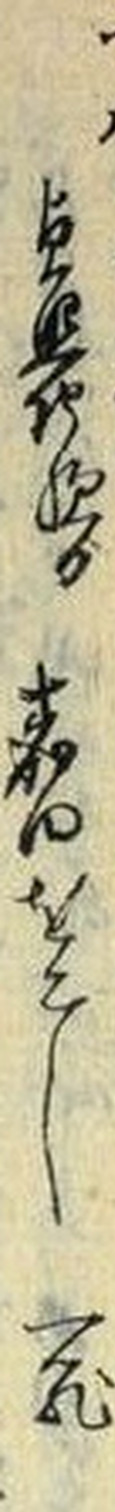貞照院様ゟ森田をこし一籠
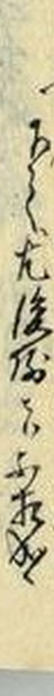下之尤後例ニハ不相成候
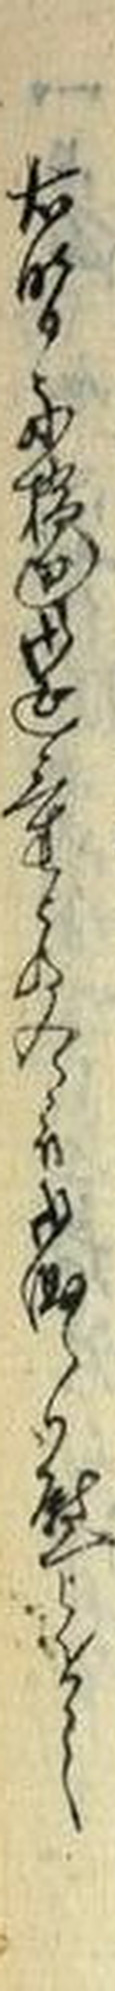右昨日舟橋辺御延気被為入候ニ付御側御慰被進之
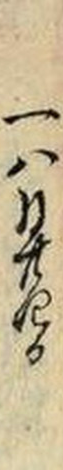一八月廿三日
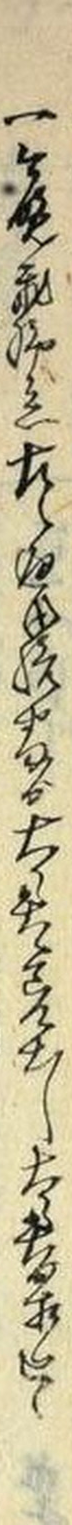一今晩飛脚立左之通御膳番ゟ大奥へ差出之大奥ゟ相廻候
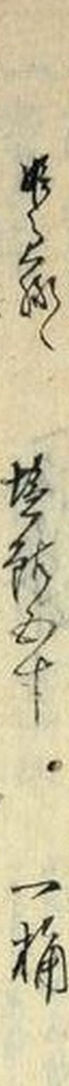姫君様へ塩鮎五十一桶
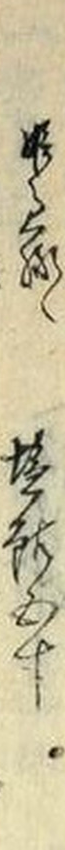姫君様へ塩鮎五十一桶
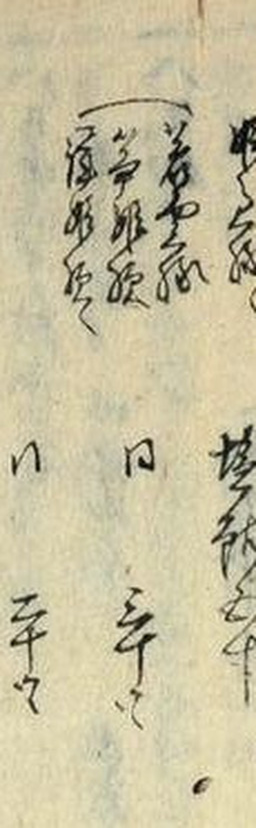箏姫様同三十ツゝ
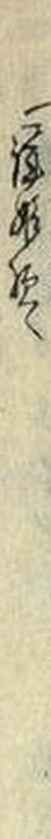謹姫様へ
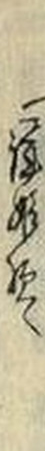謹姫様へ
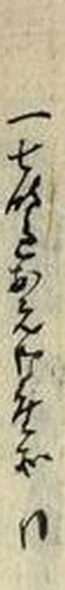一七時過於元御座所
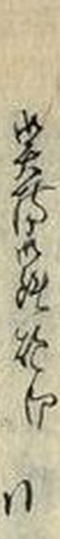御矢場御鉄砲御
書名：少傅日録抄（斉承付側向頭取日記、在国）
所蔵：福井県文書館 Fukui Prefectural Archives
